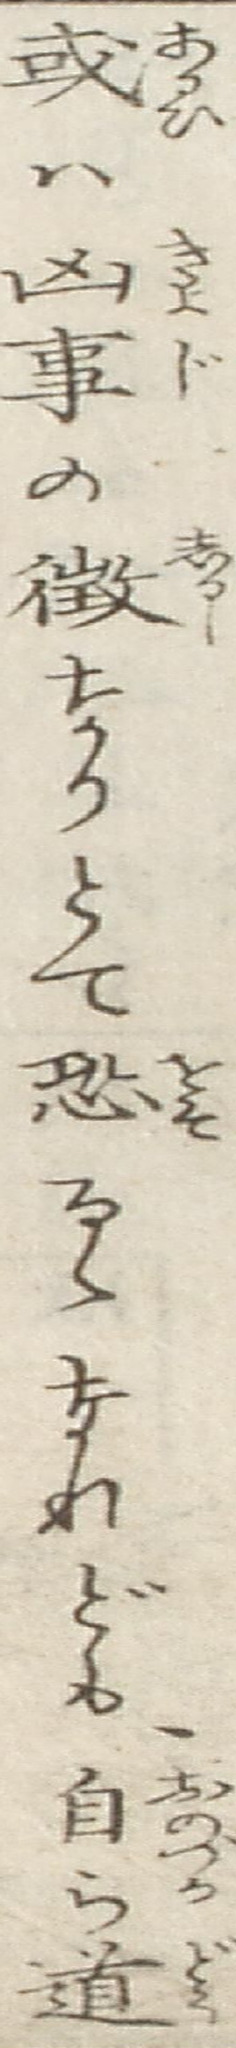或は凶事の徴なりとて恐るゝなれども、自ら道
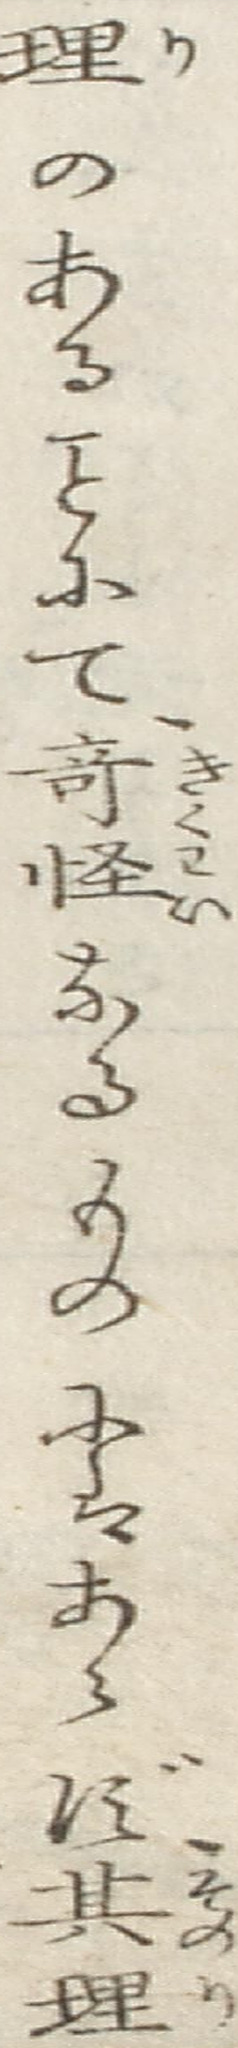理のあることにて、奇怪なるものにはあらず、其理
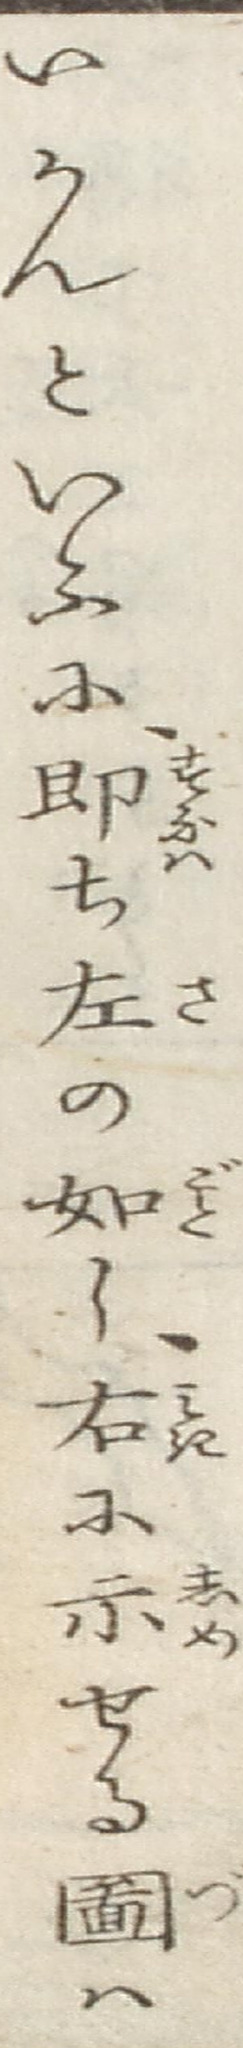いかんといふに、即ち左の如し、右に示せる図は
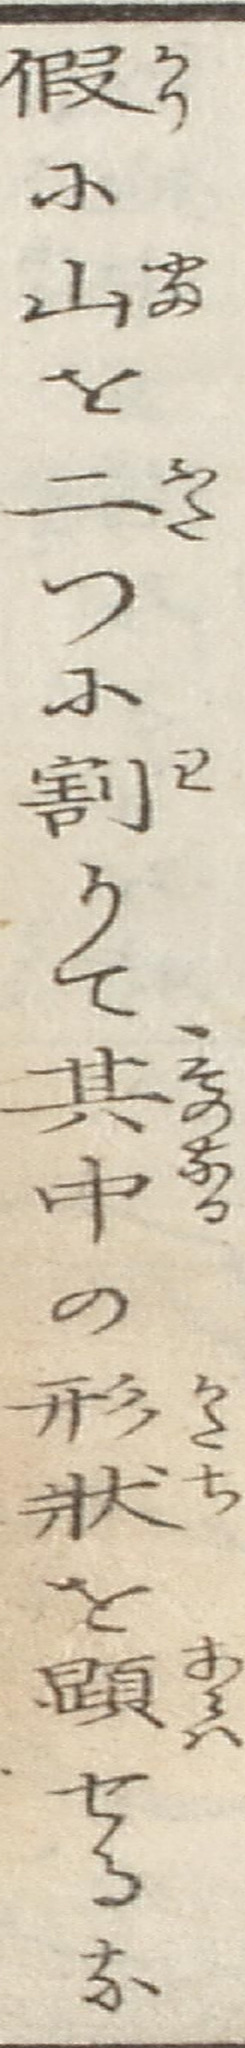仮に山を二つに割りて、其中の形状を顕せるな
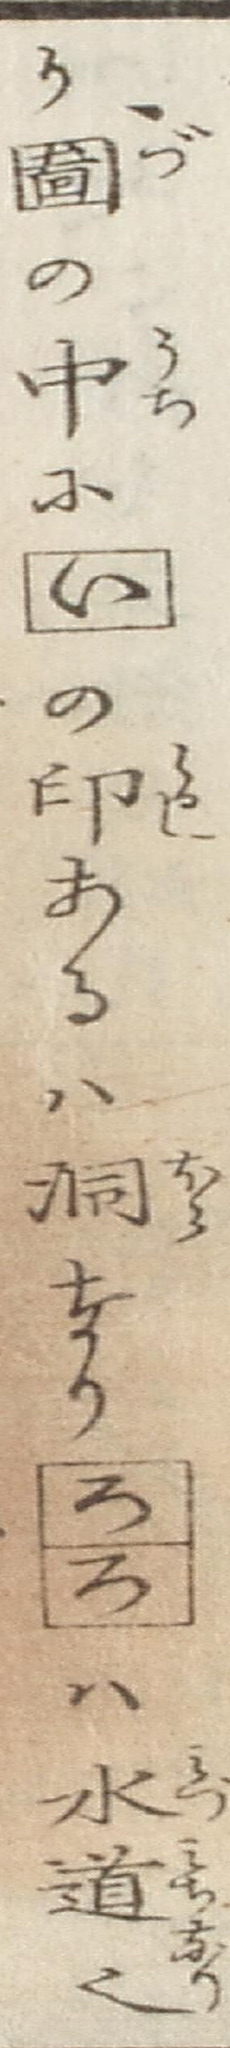り、図の中にいの印あるは洞なりろろは水道也
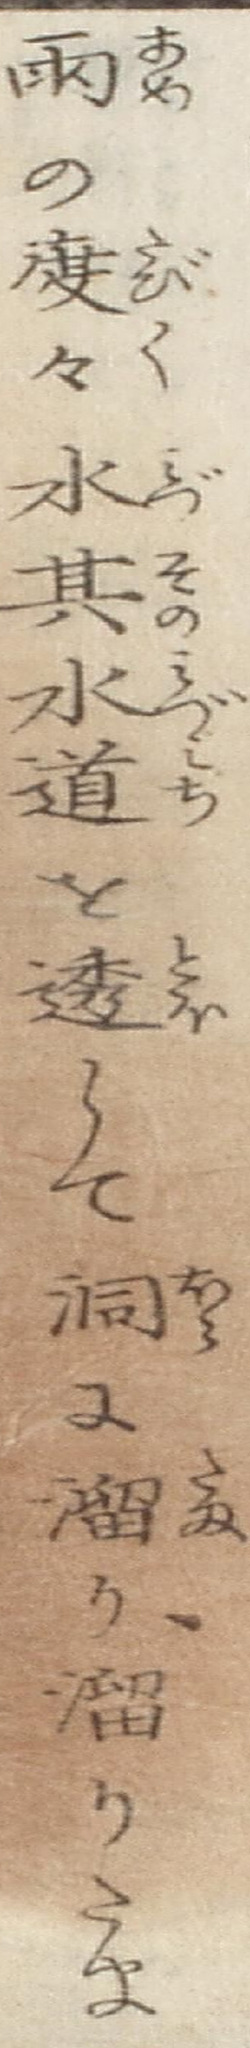雨の度々水其水道を透して洞に溜り、溜りたま
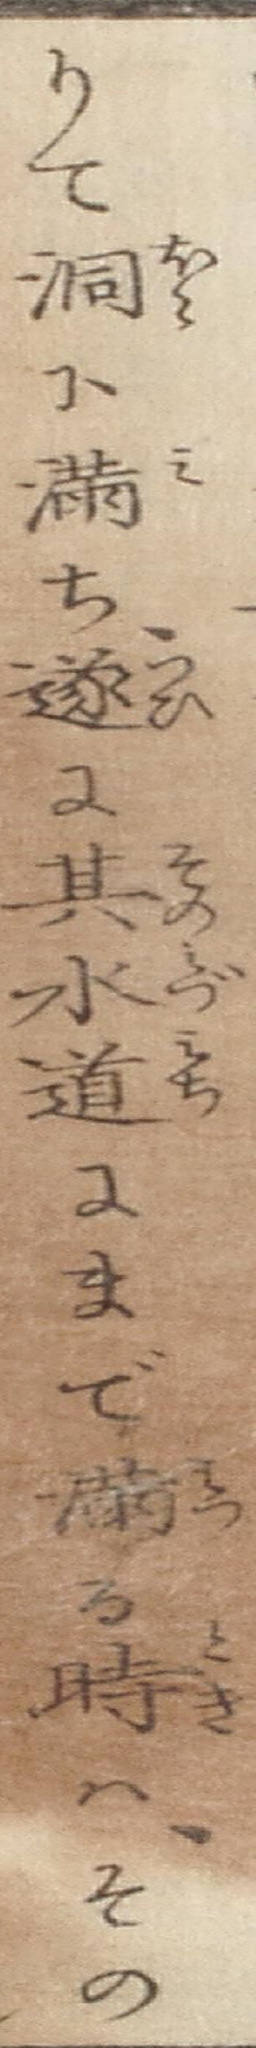りて洞に満ち、遂に其水道にまで満る時は、その
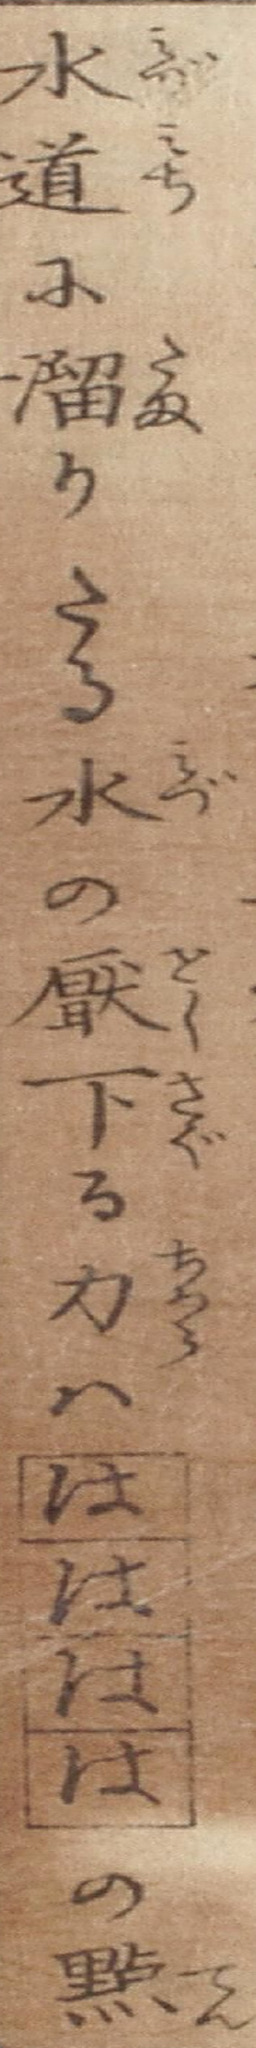水道に溜りたる水の圧下る力はははははの点
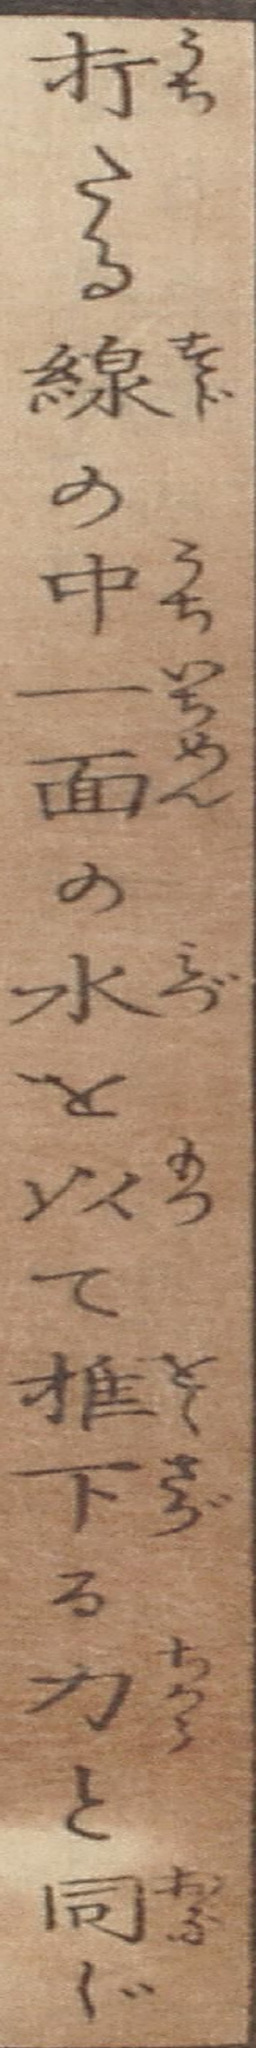打たる線の中一面の水を以て推下る力と同じ
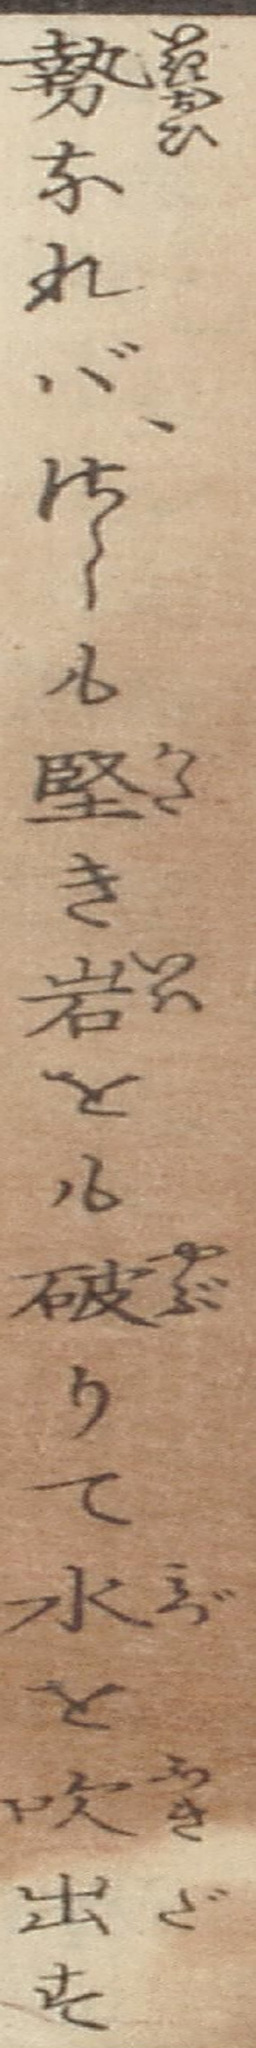勢なれば、さしも堅き岩をも破りて水を吹出す
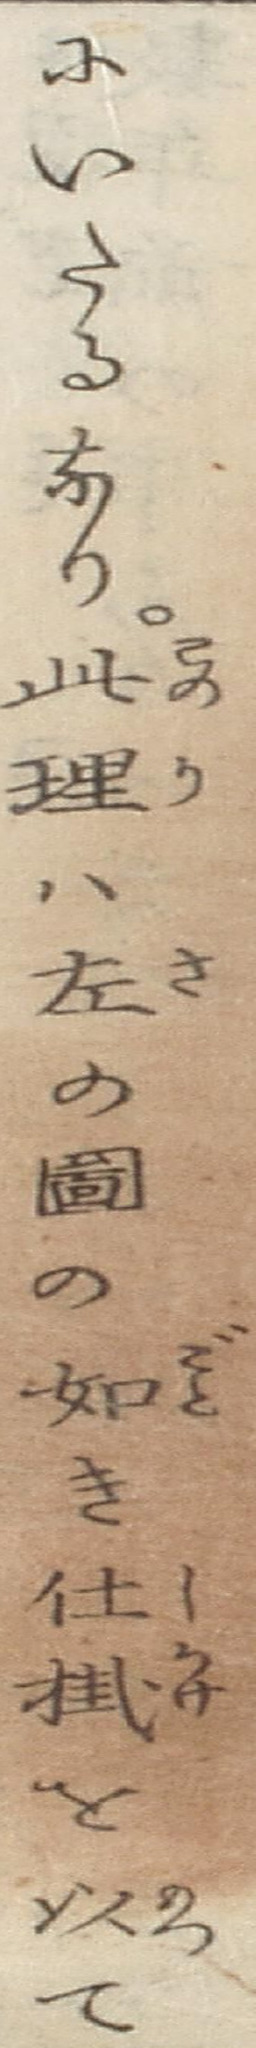にいたるなり。此理は左の図の如き仕掛を以て
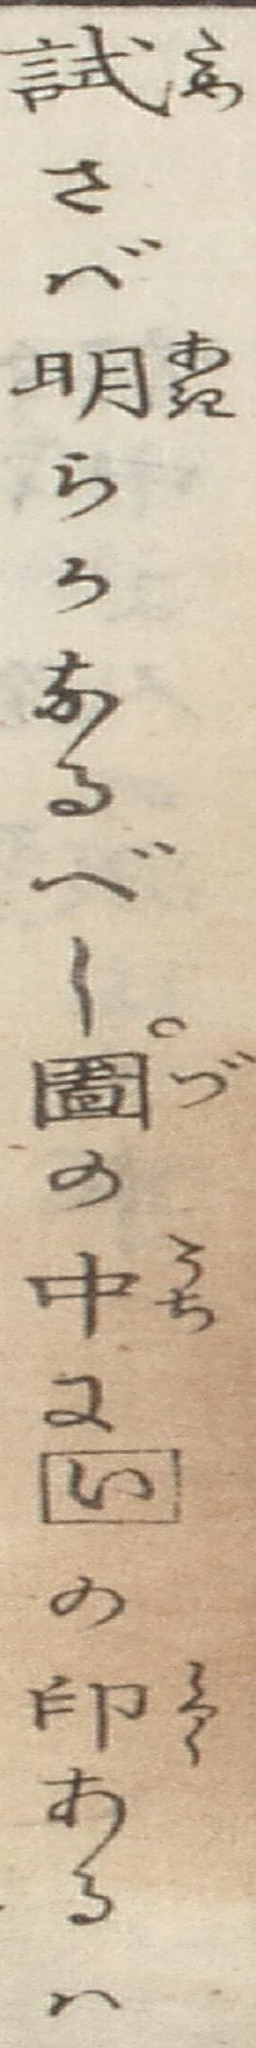試さば明らかなるべし。図の中にいの印あるは
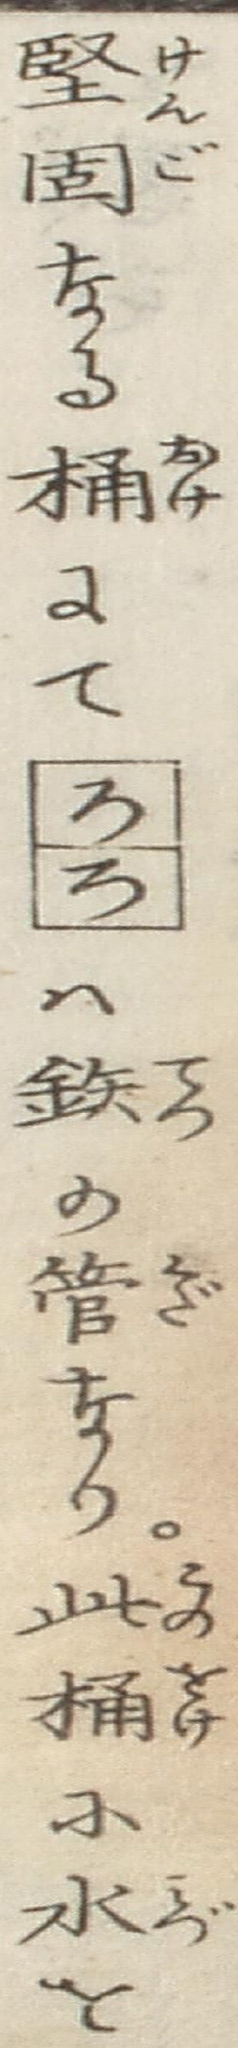堅固なる桶にてろろは鉄の管なり。此桶に水を
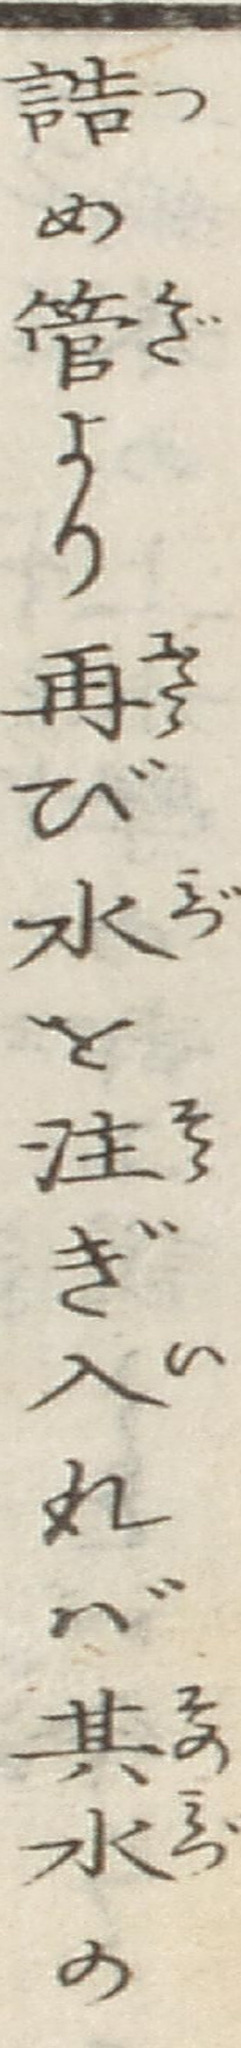詰め管より再び水を注ぎ入れば其水の

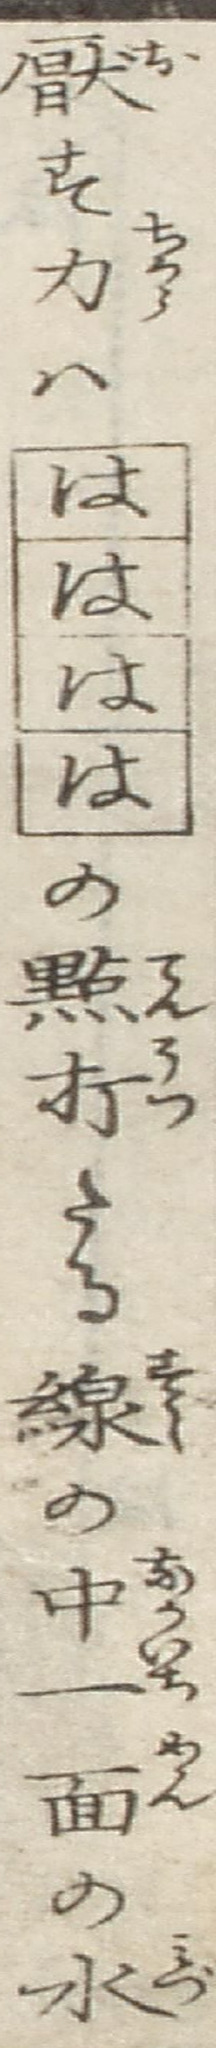圧す力はははははの点打たる線の中一面の水
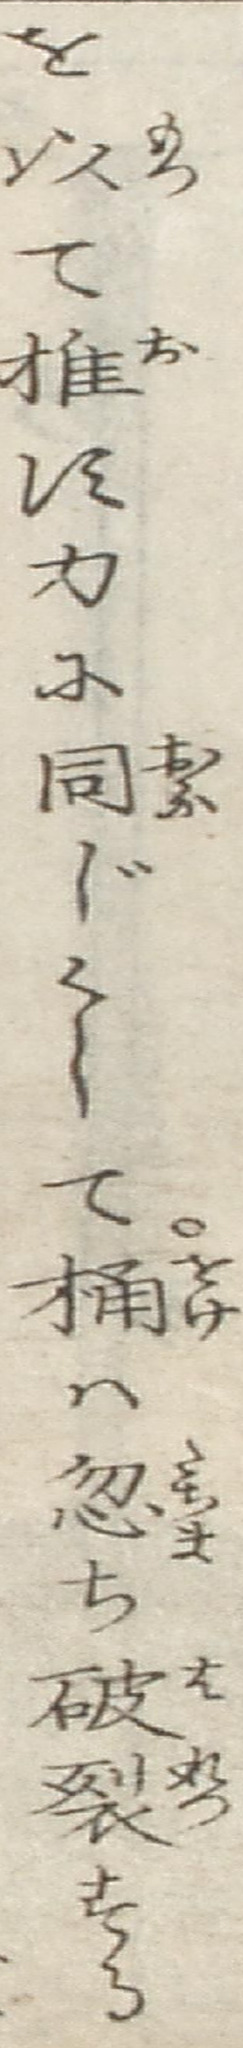を以て推す力に同じくして。桶は忽ち破裂する
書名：変異辯　一名、天變地異拾遺　全
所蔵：東京大学地震研究所図書室 Earthquake Research Institute Library, The University of Tokyo, JAPAN
